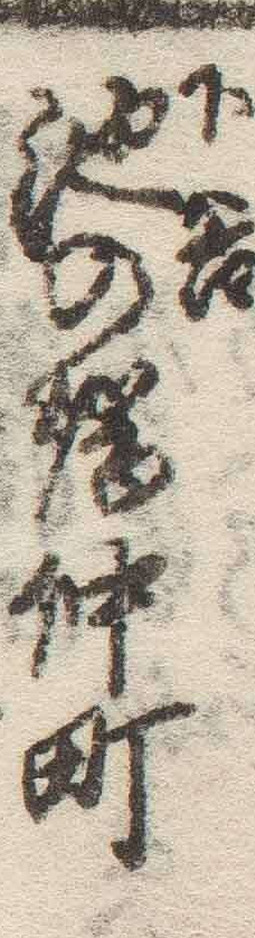池の端仲町
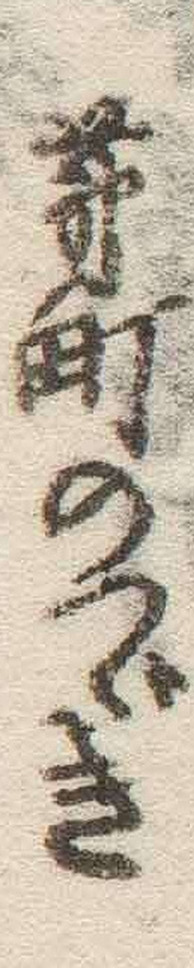茅町のつゞき
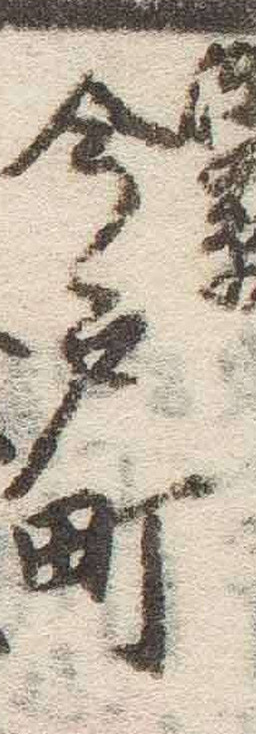今戸町
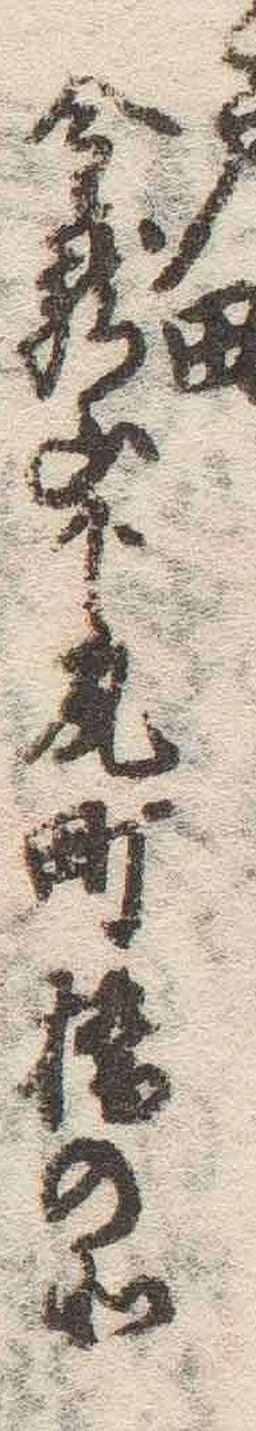金龍山下瓦町橋の北
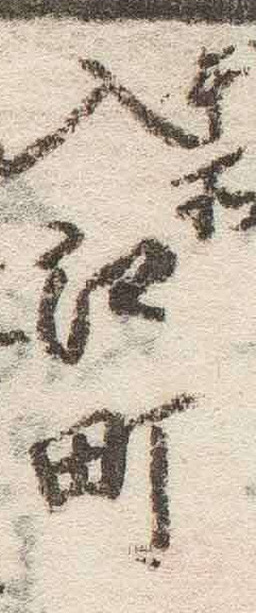入江町
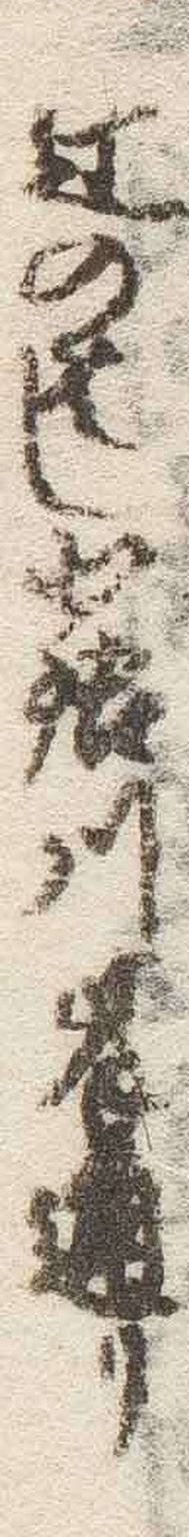辻のはし北隣川岸通り
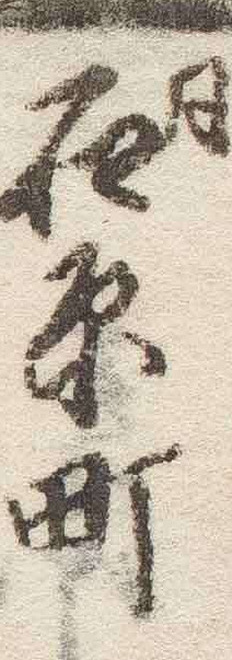石原町
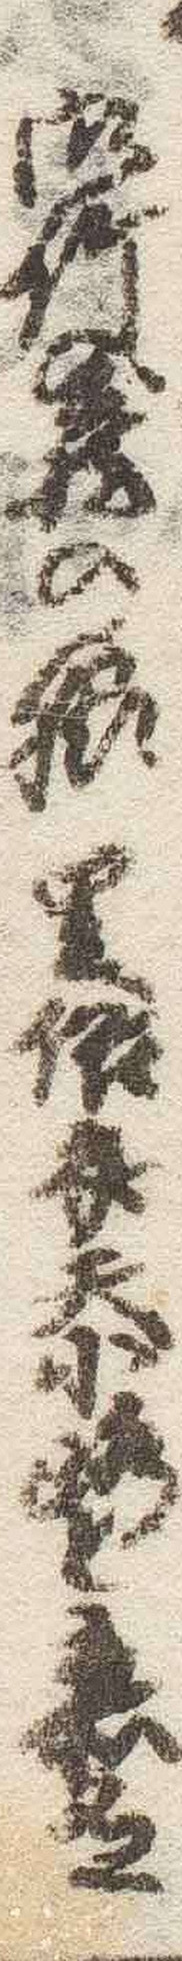御竹蔵の脇里俗弁天小路と所有
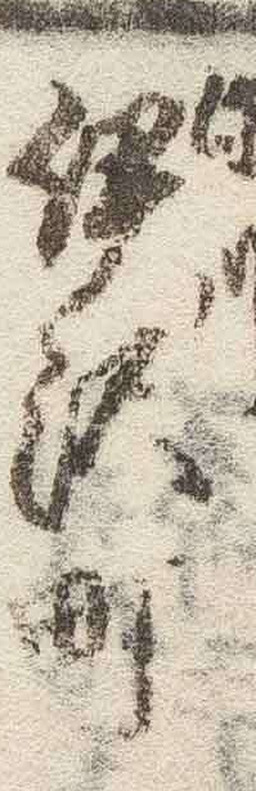伊沢町
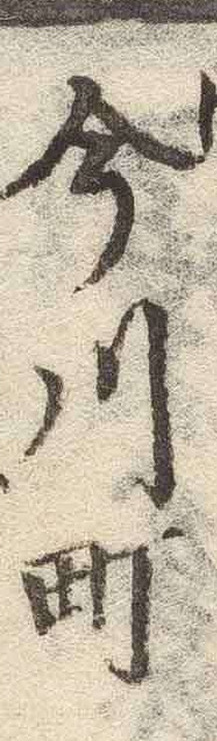今川町
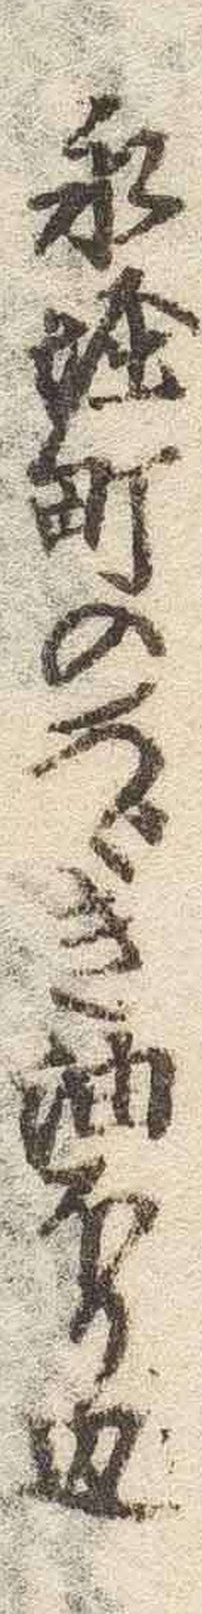永堀町のつゞき油ほり辺
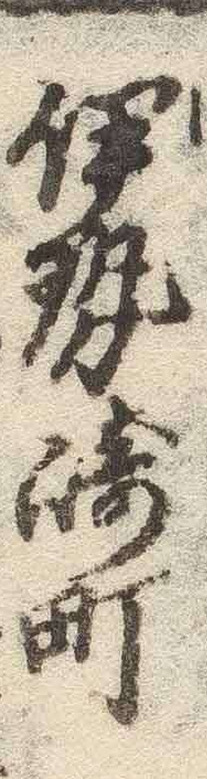伊勢崎町
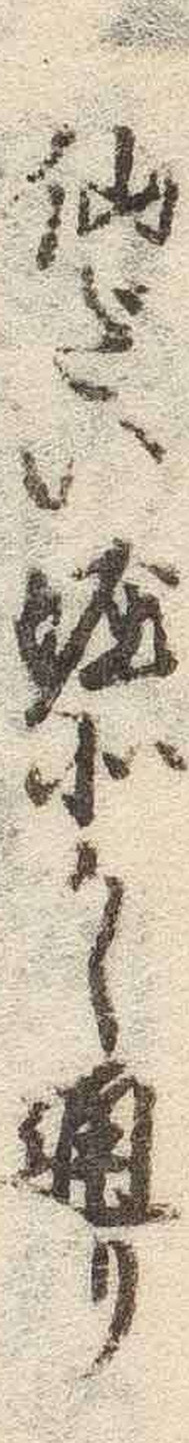仙だい堀北かし通り
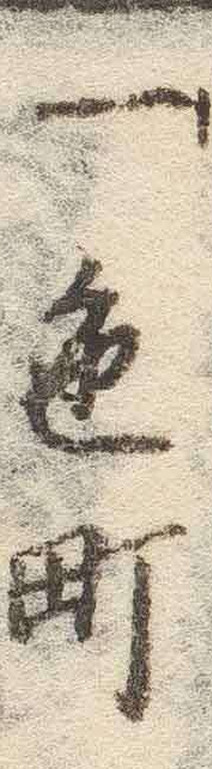一色町
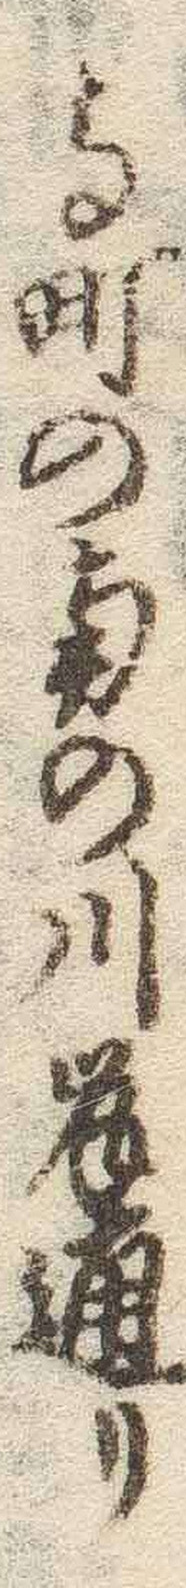高町の南の川岸通り
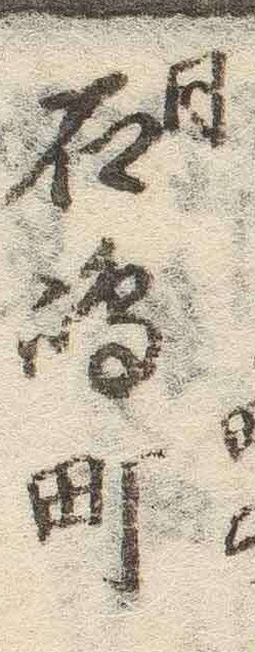石嶋町
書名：江戸町独案内
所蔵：東京学芸大学附属図書館 国文学研究資料館
